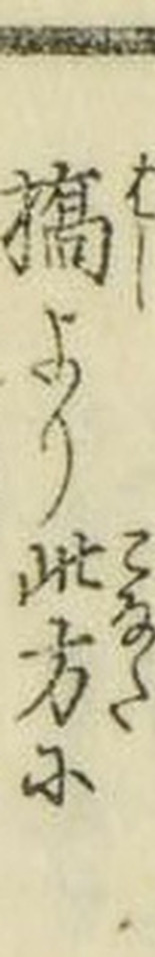橋より此方に
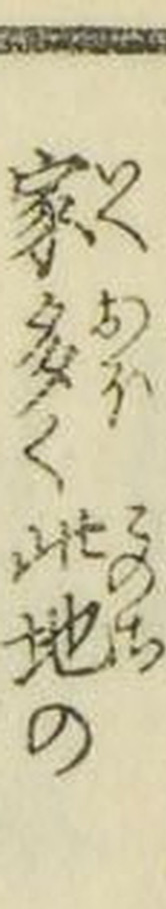家多く此地の
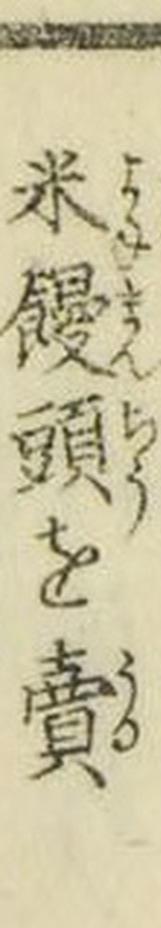米饅頭を賣
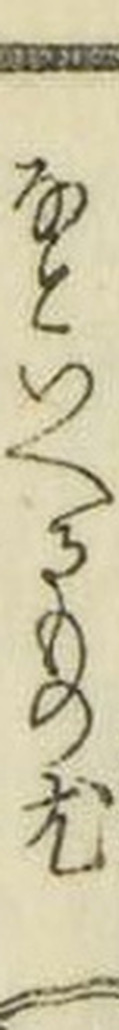なといへるもの尤
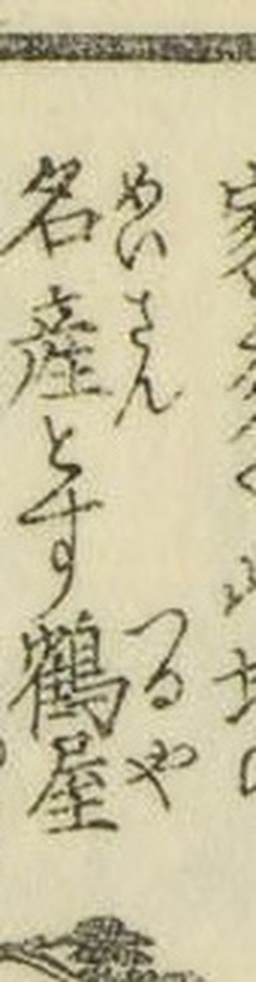名産とす鶴屋
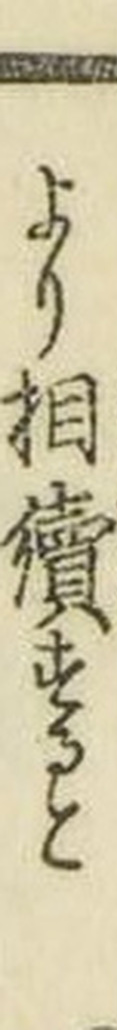より相續すると
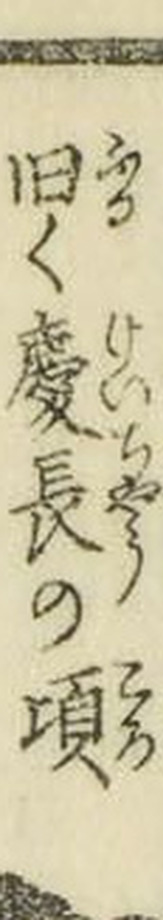旧く慶長の頃
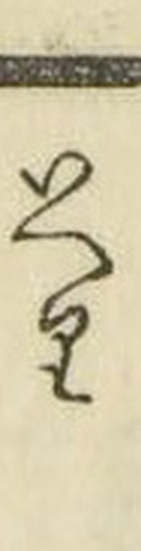いへり

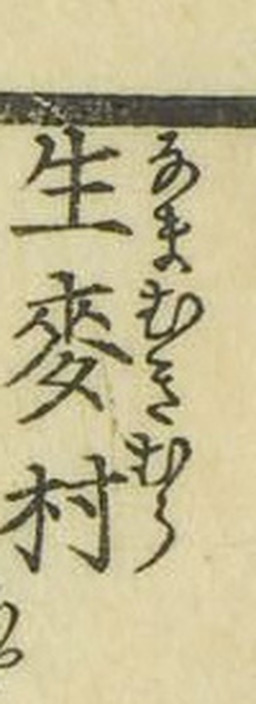生麥村
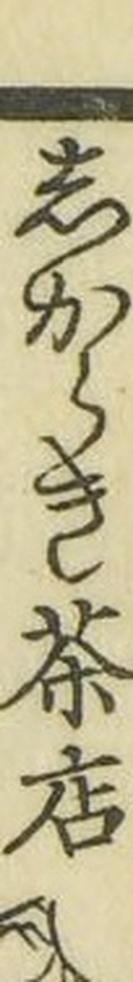しからき茶店
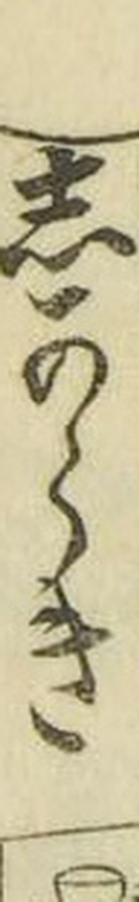しからき
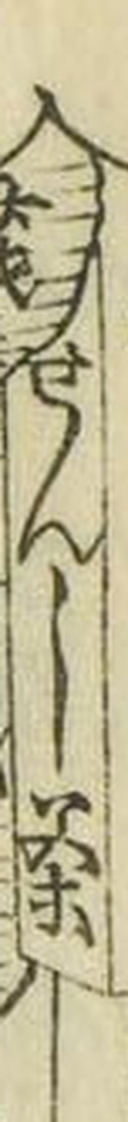せんし茶
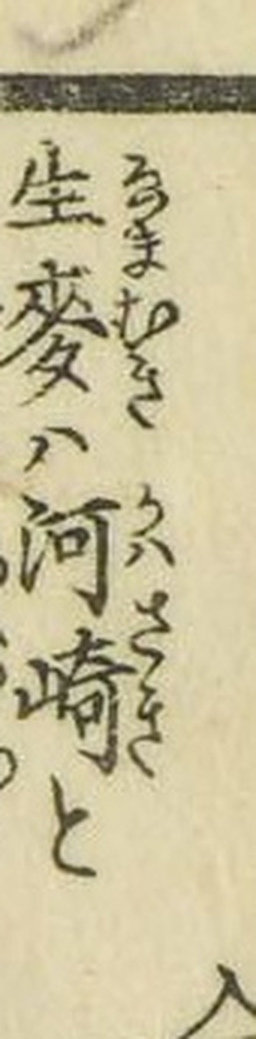生麥は河崎と
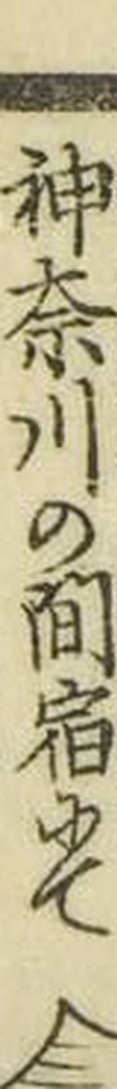神奈川の間宿にて
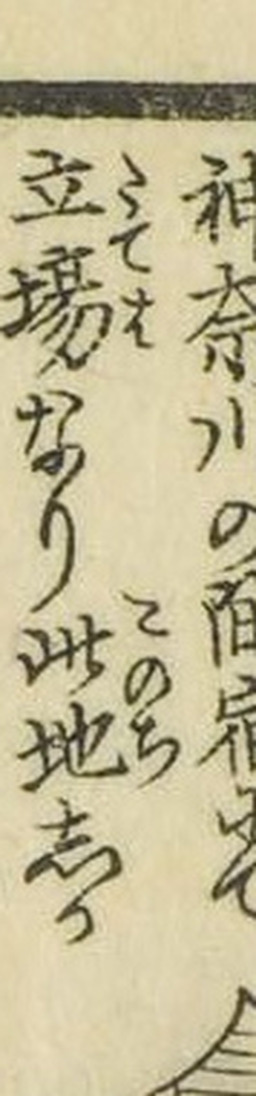立場なり此地しか
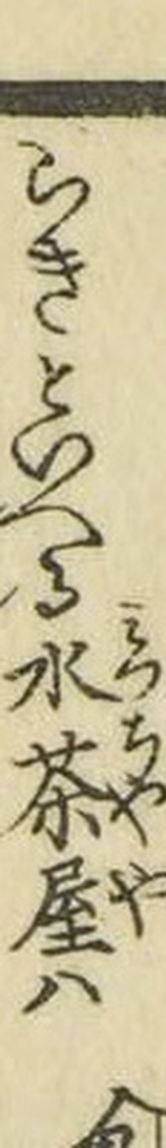らきといへる水茶屋は
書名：江戸名所図会 20巻 巻之5
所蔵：東京学芸大学教育コンテンツアーカイブ
